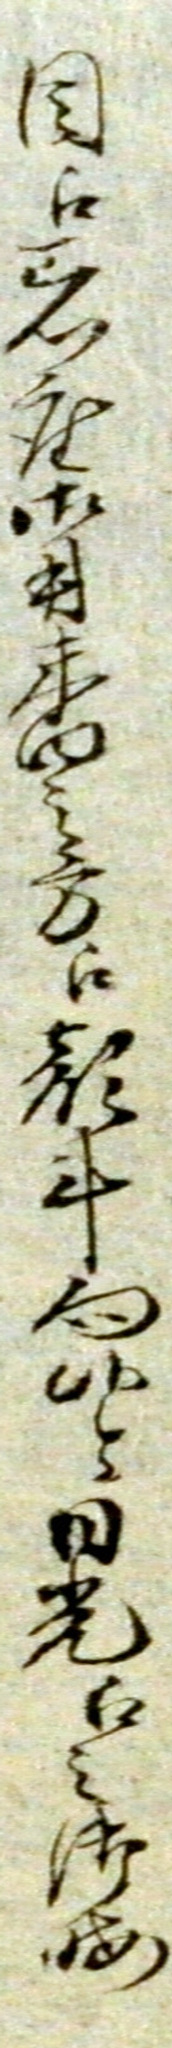目江着座御用番之方江顔斗向け候と日光江之御暇
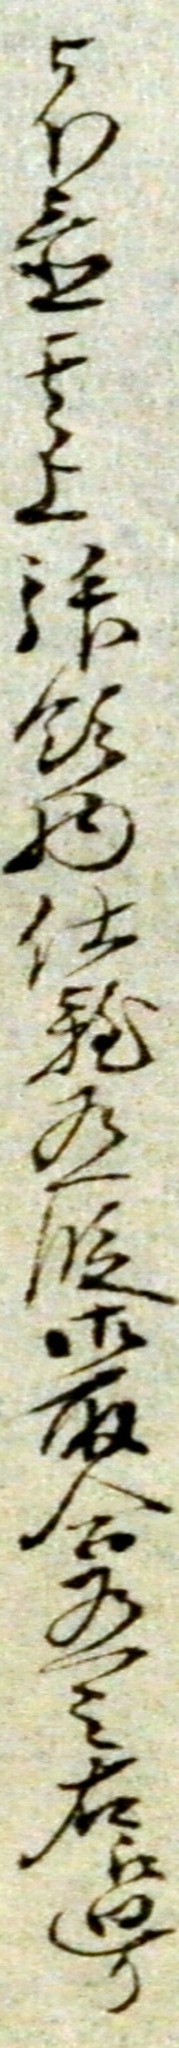被下置其上拝領物仕難有段御取合有之右江廻り
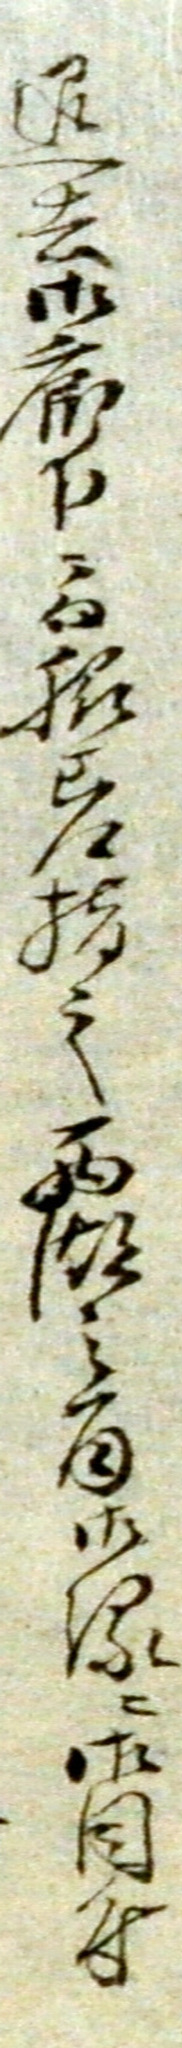退去御廊下ニ而脇差指之西湖之間御縁ニ御目付
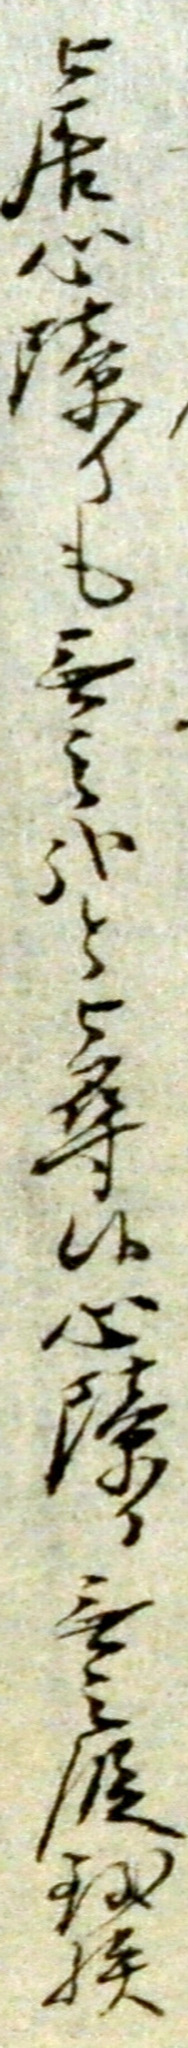被居心障りも無之哉と被尋候心障り無之段致挨
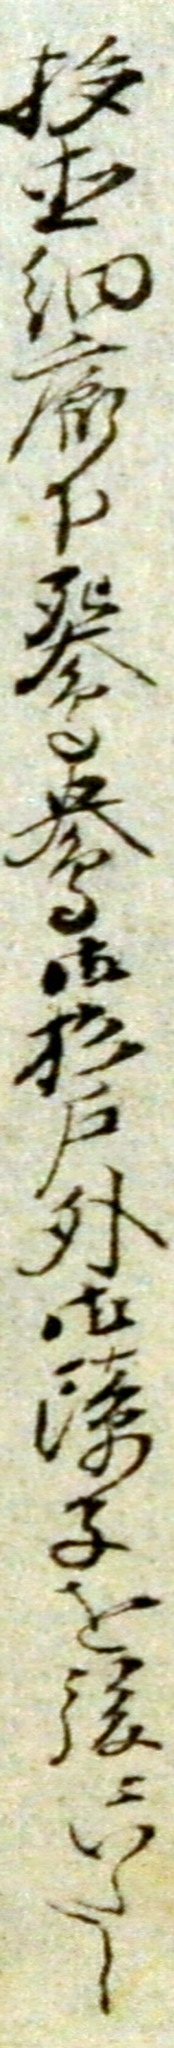拶直細廊下鴛鴦御杉戸外御障子を後ニいたし
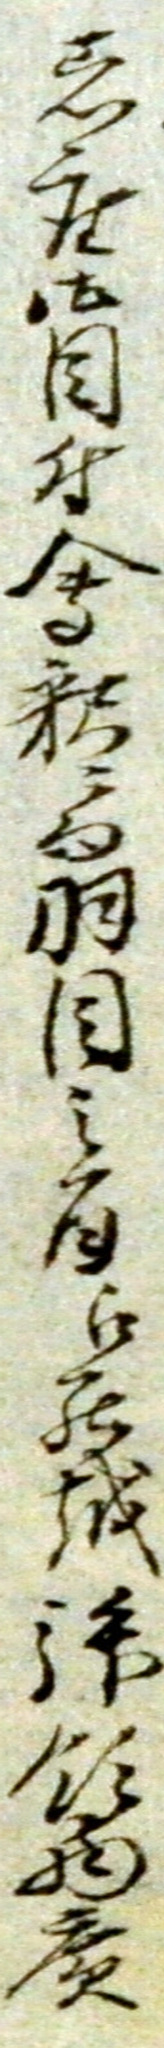着座御目付会釈ニ而羽目之間江罷越拝領物廣
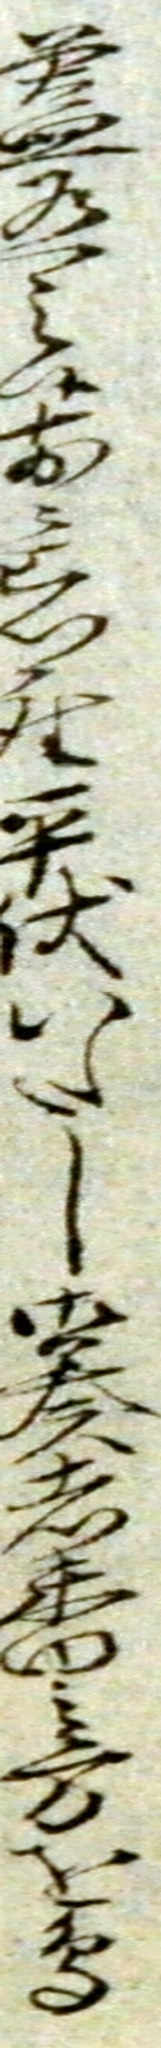蓋有之候前ニ着座平伏いたし御奏者番之方を鳥

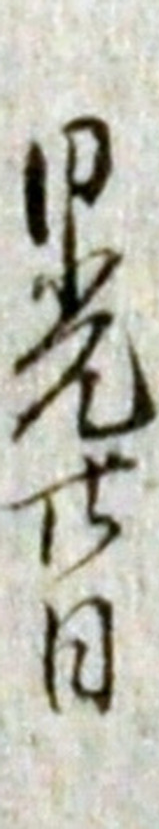日光廿日
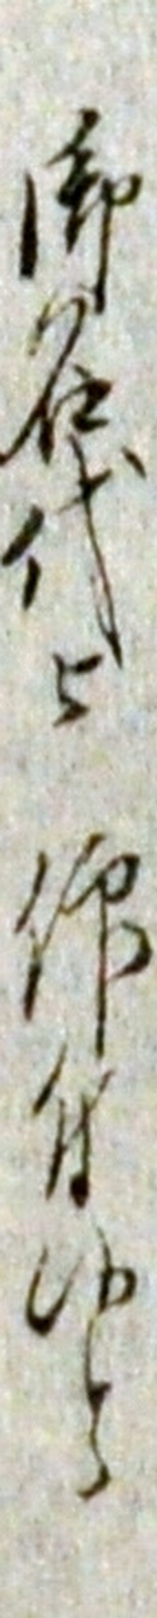御名代被仰付候ニ付
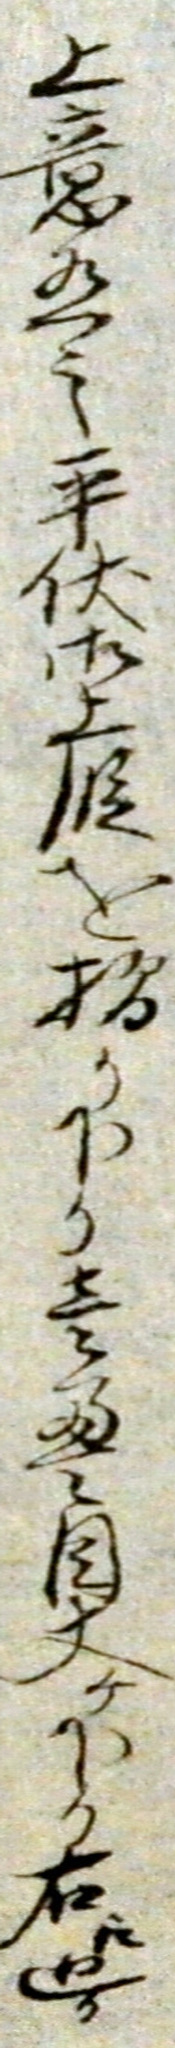上意有之平伏御上段を摺り下り壱畳目丈ケ下り右江廻り
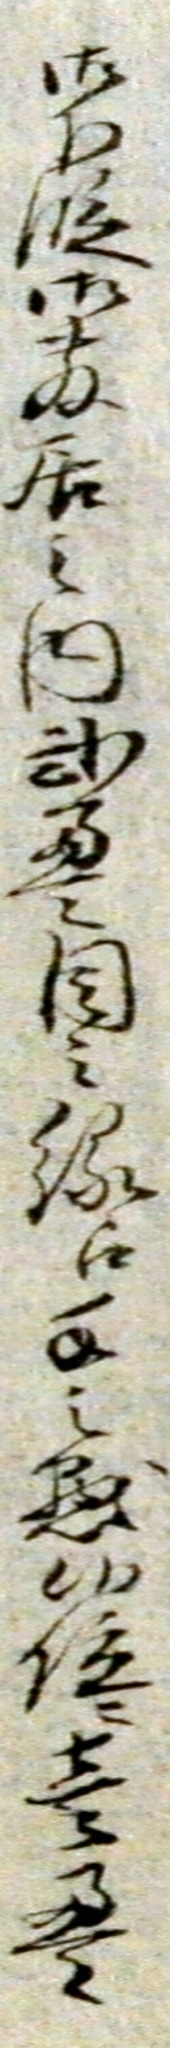御下段御敷居之内弐畳目縁江手之懸候位二壱畳
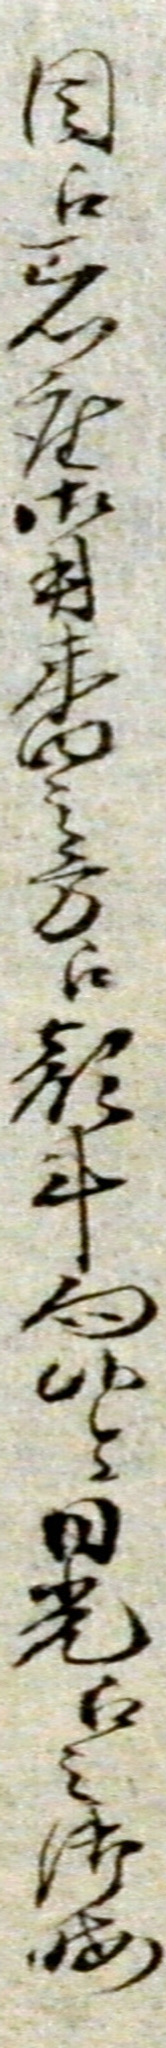目江着座御用番之方江顔斗向候より日光江之御暇
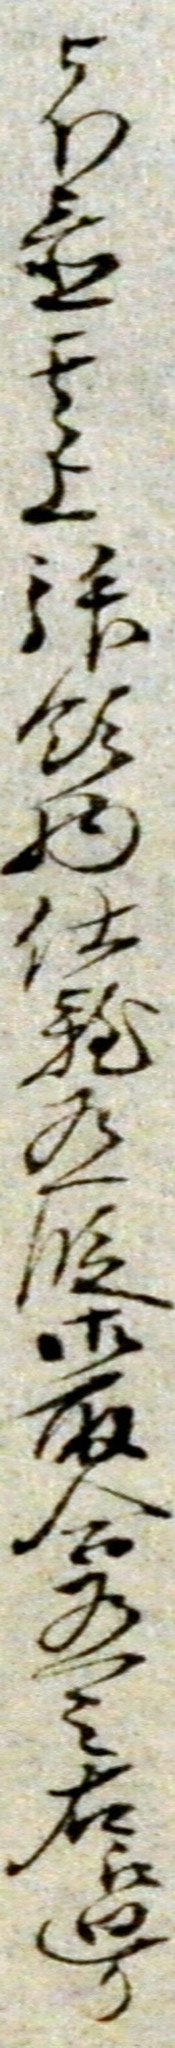ヒ下置其上拝領物仕難有段御取合有之右江廻り
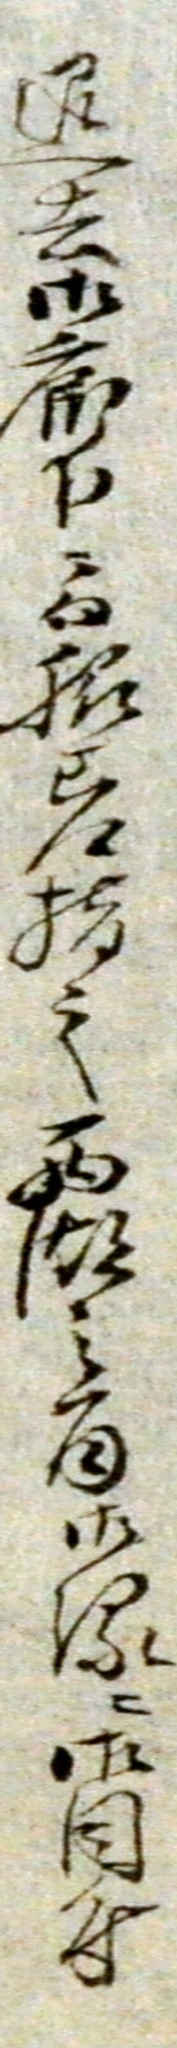退去御廊下ニ而脇差指之西湖之間御縁二御目付
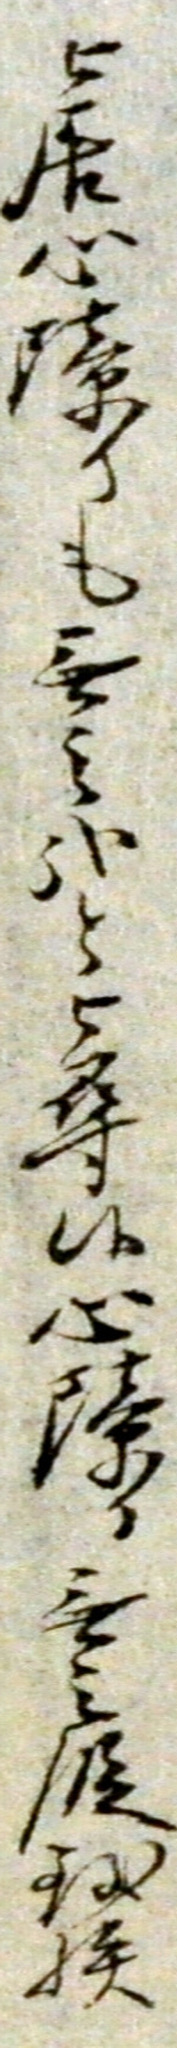ヒ居心障りも無之哉とヒ尋候心障り無之候段致挨
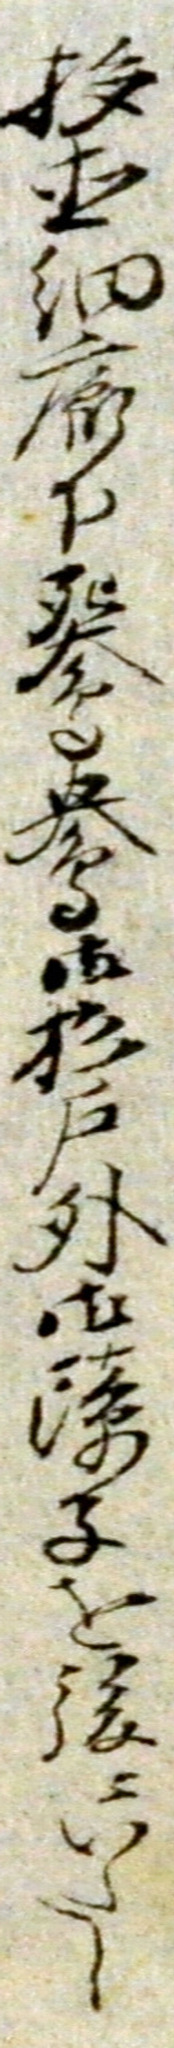拶直細廊下鴛鴦御杉戸外御障子を後二いたし
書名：日光御名代相勤候節ノ留
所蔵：伊那市立高遠町図書館・合同会社AMANE
